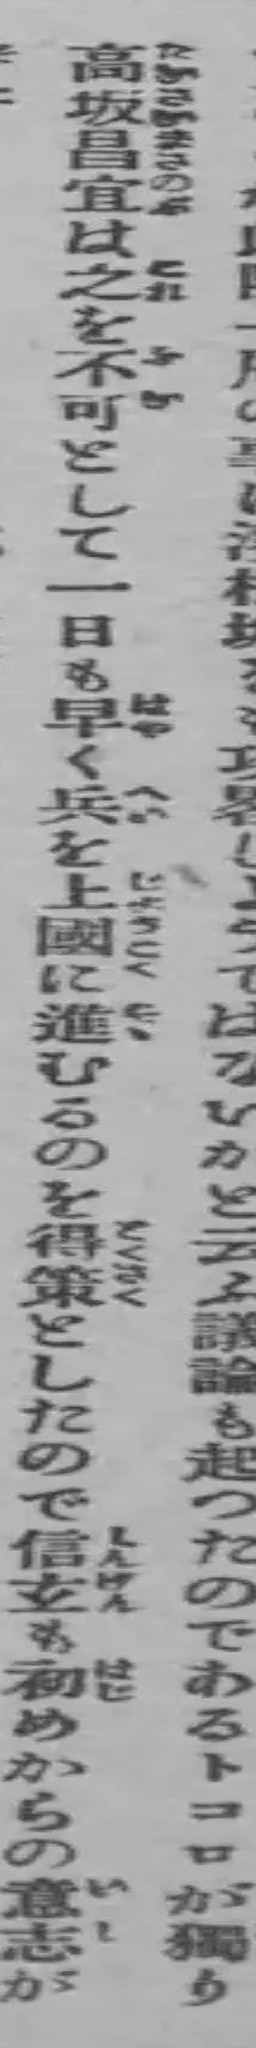高坂昌宜は之を不可として一日も早く兵を上国に進むるのを得策としたので信玄も初めからの意志が
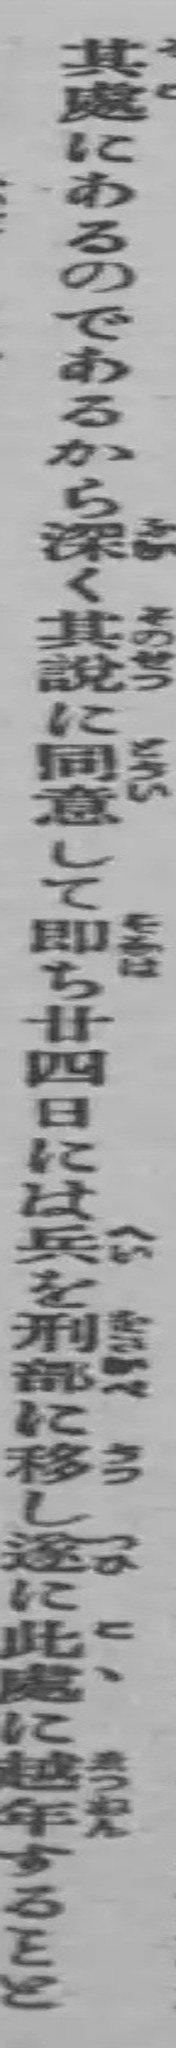其処にあるのであるから深く其説に同意して即ち廿四日には兵を刑部に移し遂に此処に越年することと
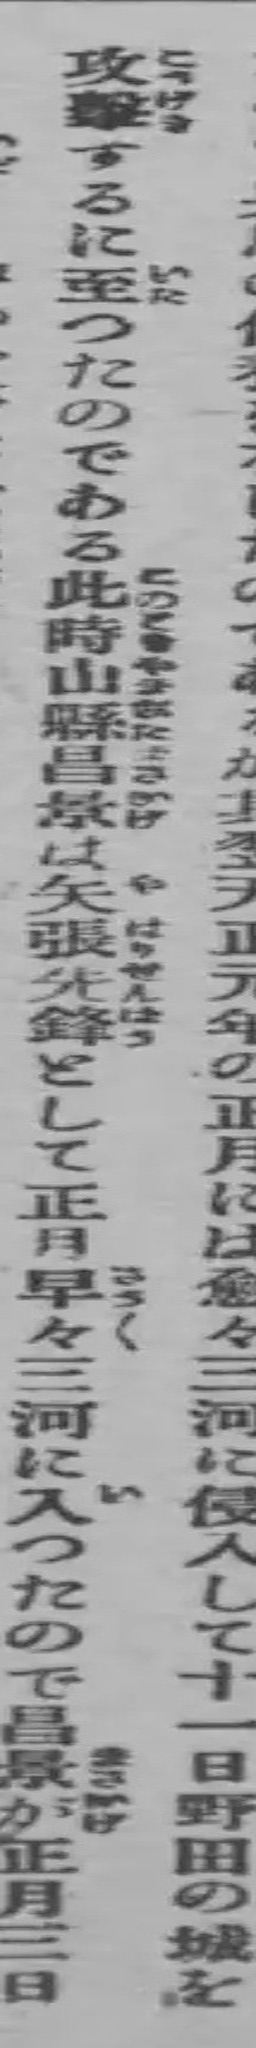を囲む攻撃するに至つたのである此時山縣昌景は矢張先鋒として正月早々三河に入つたので昌景が正月三日
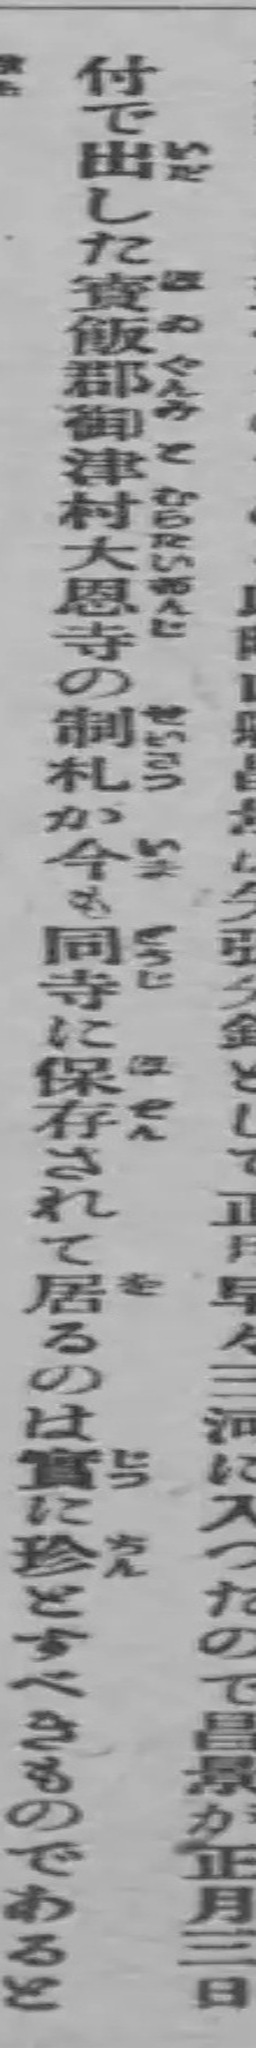大恩寺文書付で出した宝飯郡御津村大恩寺の制札か今も同寺に保存されて居るのは実に珍とすべきものであると
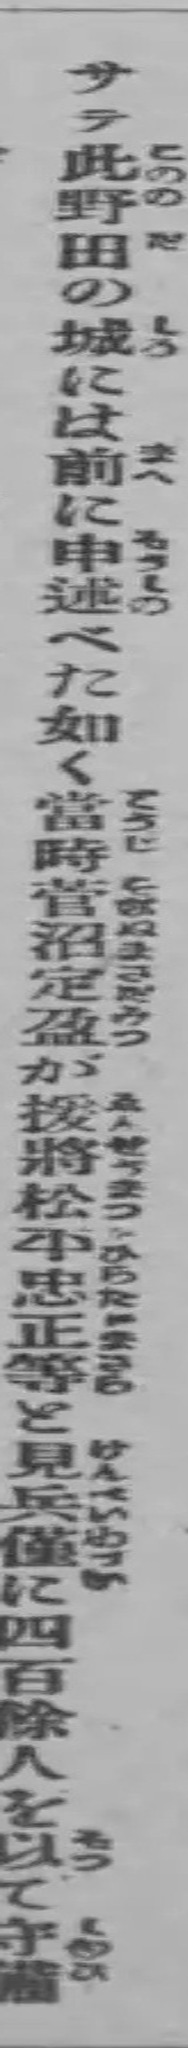サテ此野田の城には前に申述べた如く当時菅沼定盈が援将松平忠正等と見兵僅に四百余人を以て守備
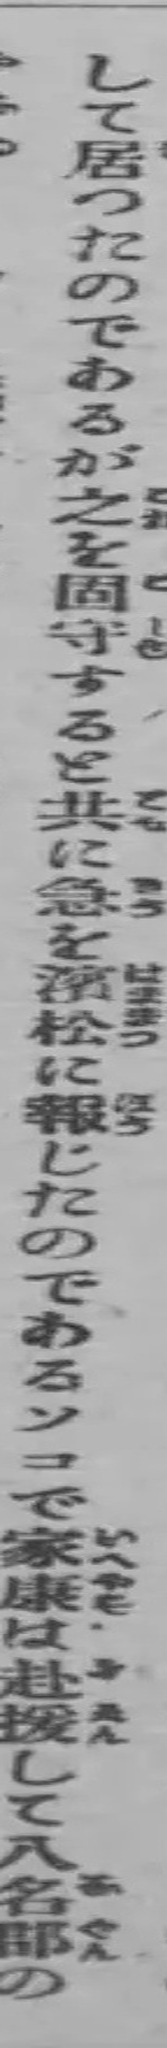して居つたのであるが之を固守すると共に急を浜松に報じたのであるソコで家康は赴援して八名郡の
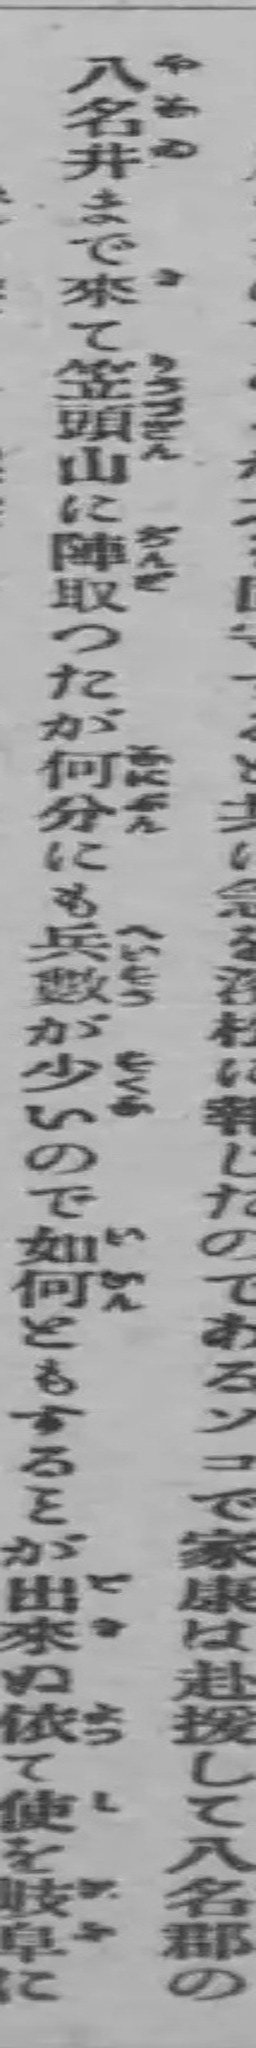八名井まで来て笠頭山に陣取つたが何分にも兵数が少いので如何ともすることが出来ぬ依て使を岐阜に
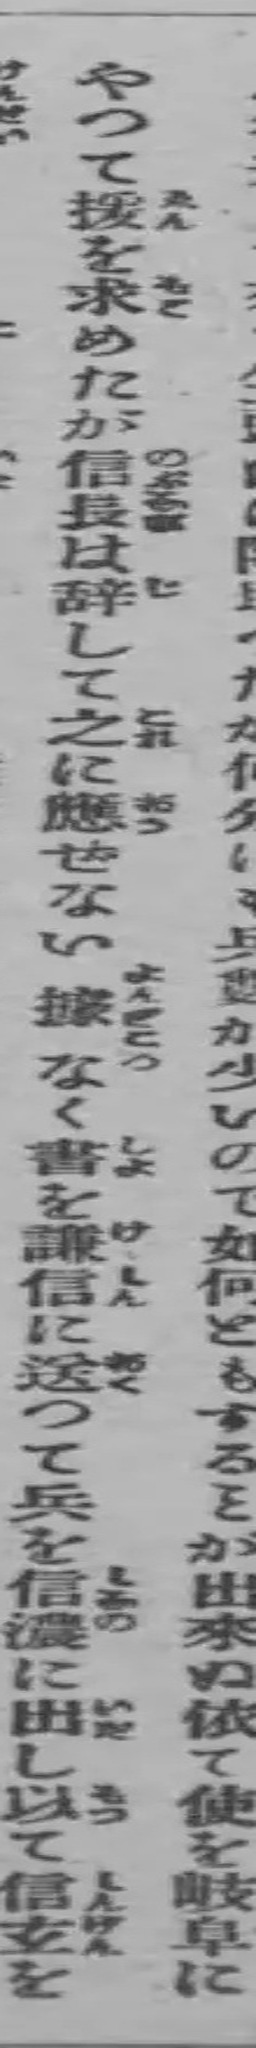やつて援を求めたが信長は辞して之に応ぜない拠なく書を謙信に送つて兵を信濃に出し以て信玄を
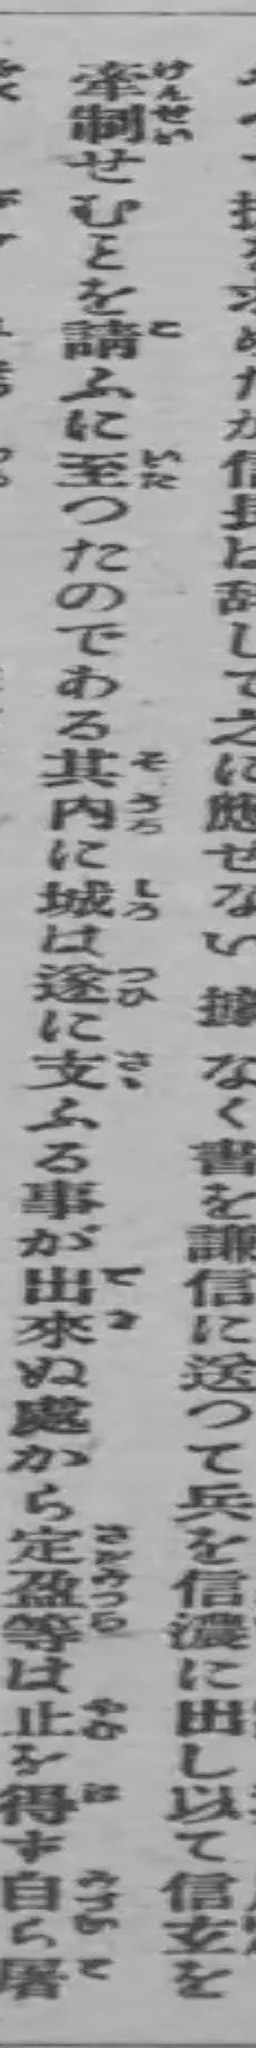牽制せむことを請ふに至つたのである其内に城は遂に支ふる事が出来ぬ処から定盈等は止を得ず自ら屠
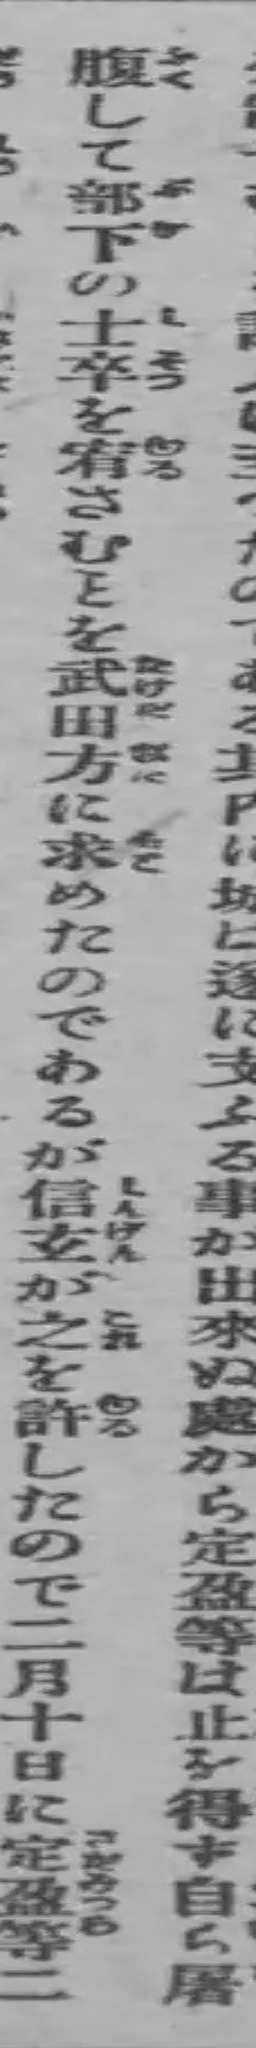腹して部下の士卒を宥さむことを武田方に求めたのであるが信玄が之を許したので二月十日に定盈等二
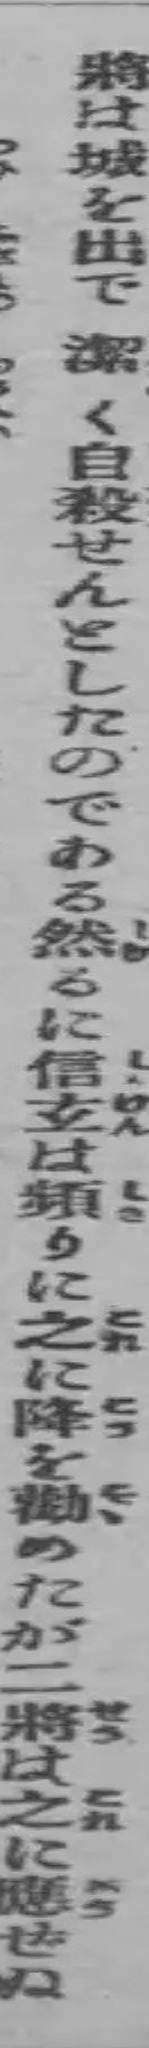野田城落つ将は城を出で潔く自殺せんとしたのである然るに信玄は頻りに之に降を勧めたが二将は之に応ぜぬ
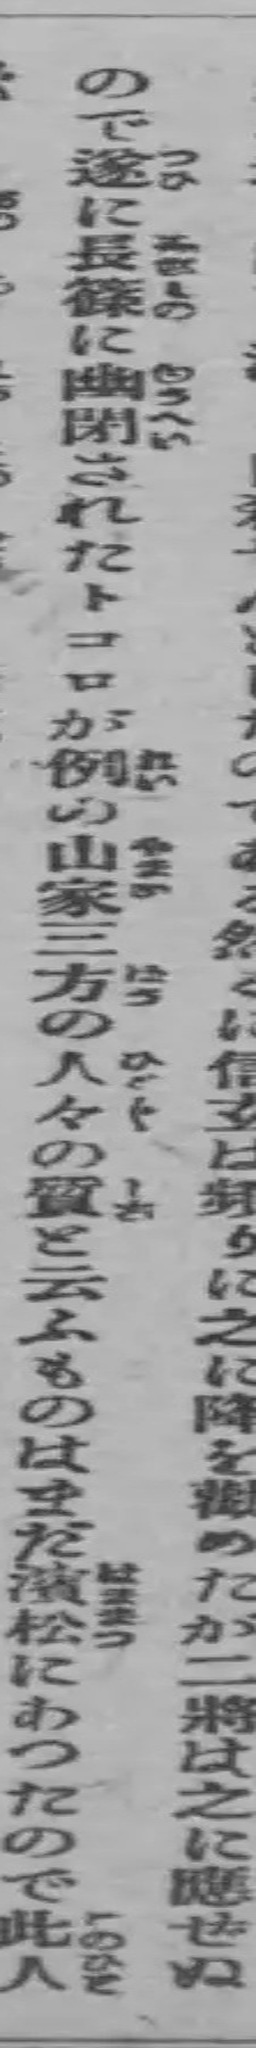ので遂に長篠に幽閉されたトコロが例の山家三方の人々の質と云ふものはまだ浜松にあつたので此人
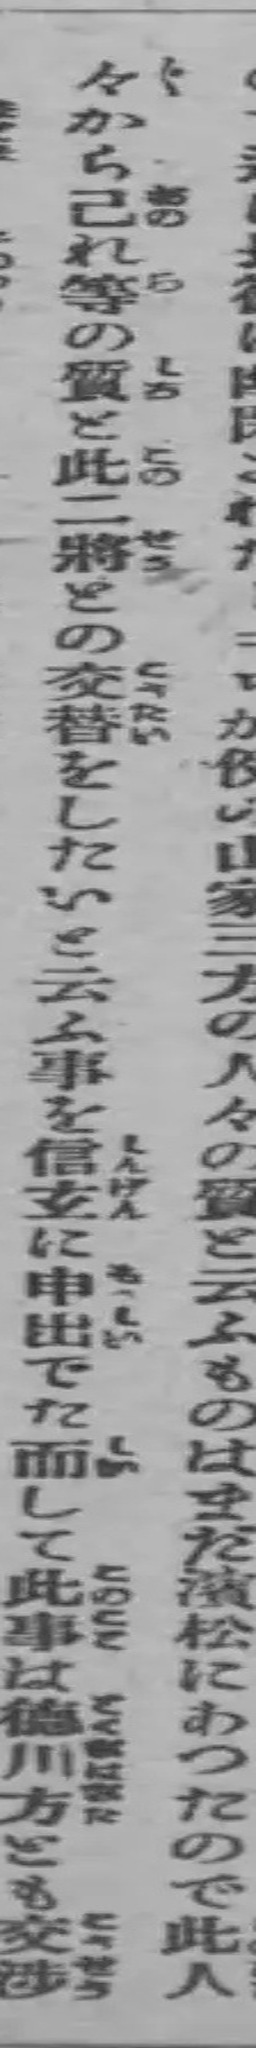人から己れ等の質と此二将との交替をしたいと云ふ事を信玄に申出でた而して此事は徳川方とも交渉
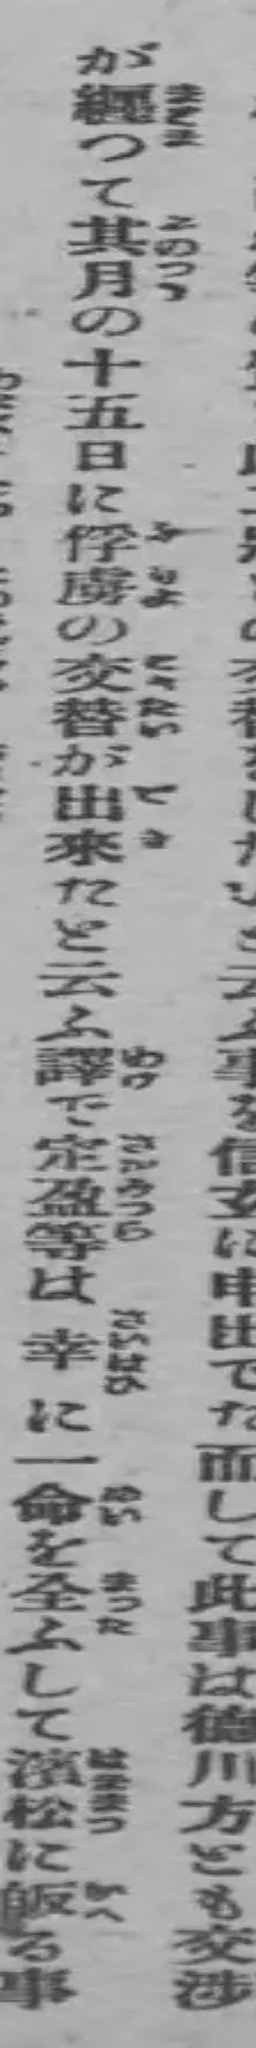が纏つて其月の十五日に俘虜の交替が出来たと云ふ訳で定盈等は幸に一命を全ふして浜松に皈る事
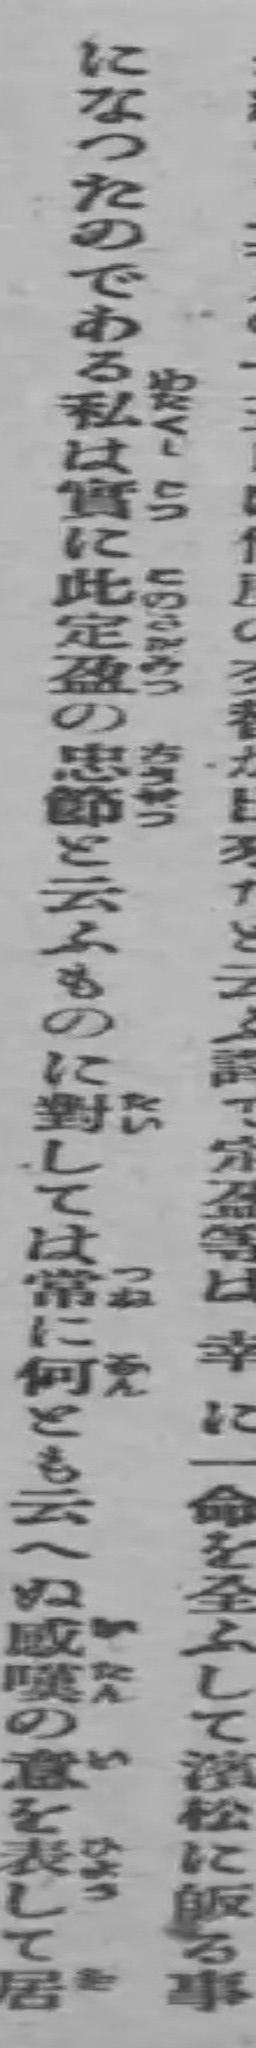になつたのである私は実に此定盈の忠節と云ふものに対しては常に何とも云へぬ感嘆の意を表して居
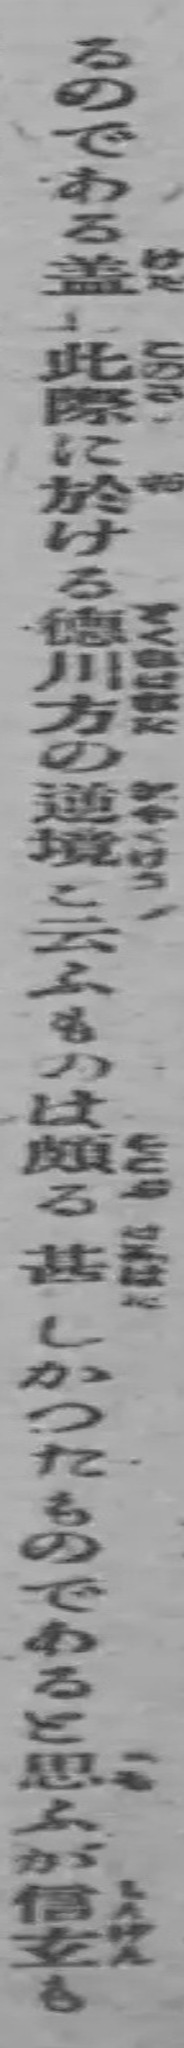信玄病を獲るのである蓋し此際に於ける徳川方の逆境と云ふものは頗る甚しかつたものであると思ふが信玄も
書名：豊橋市史談
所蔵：国立国会図書館 National Diet Library, JAPAN
